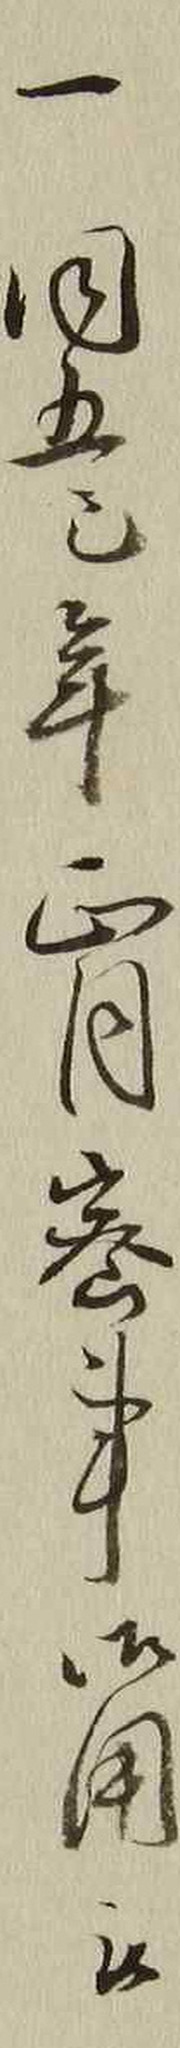一同五巳年正月密事御用被
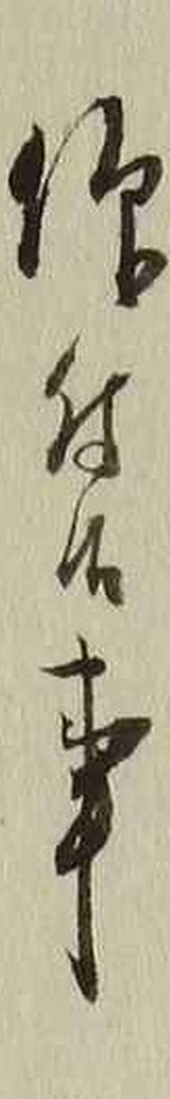仰付候事
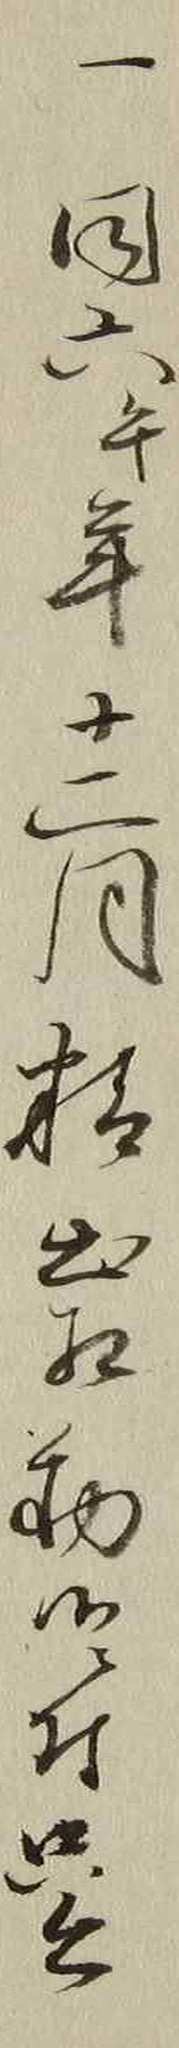一同六午年十二月精出相勤候ニ付只今
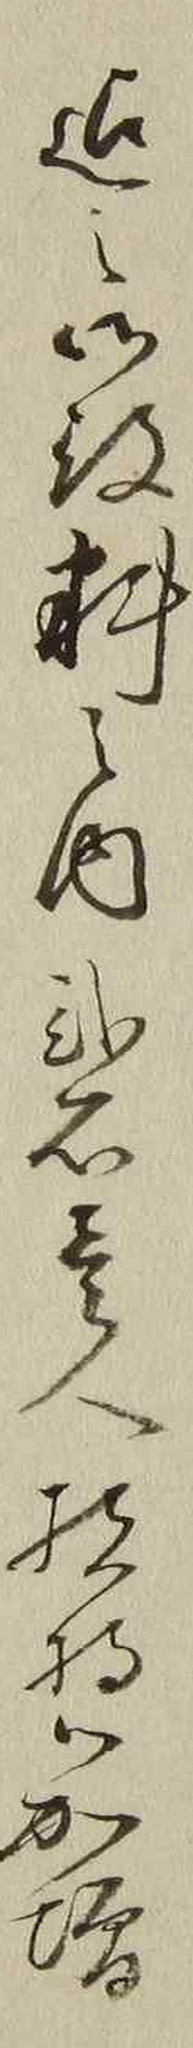迄之御役料之内弐石壱人扶持御加増
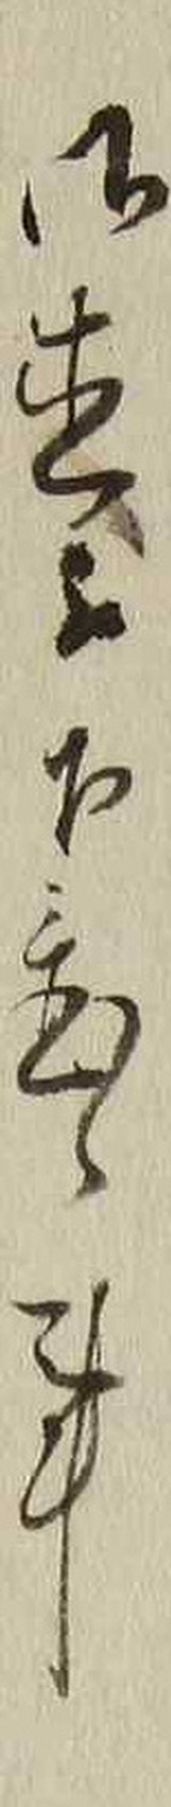御直被下置候事
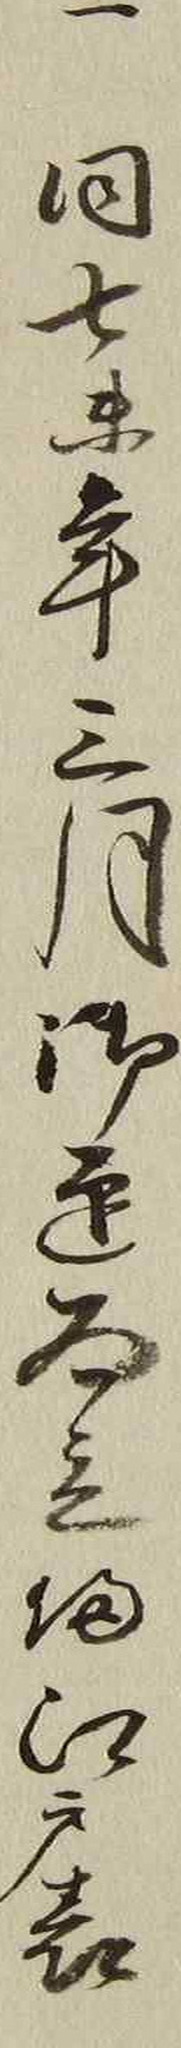一同七未年三月御迎為立帰江戸表
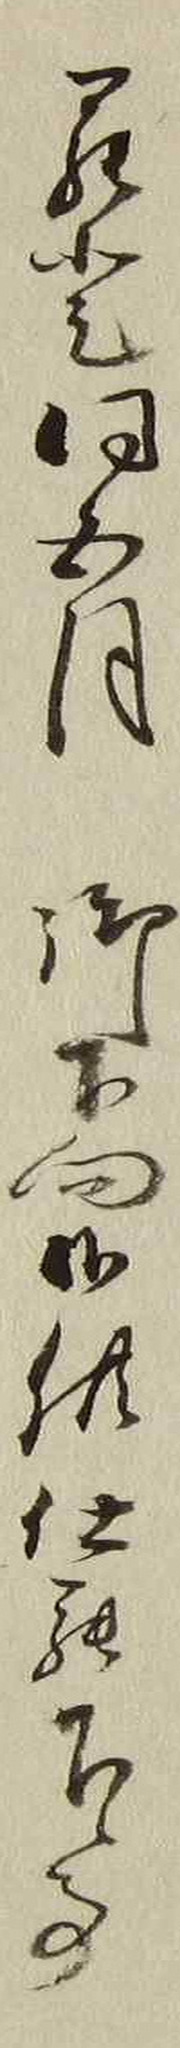罷登同五月御下向御供仕罷下候事
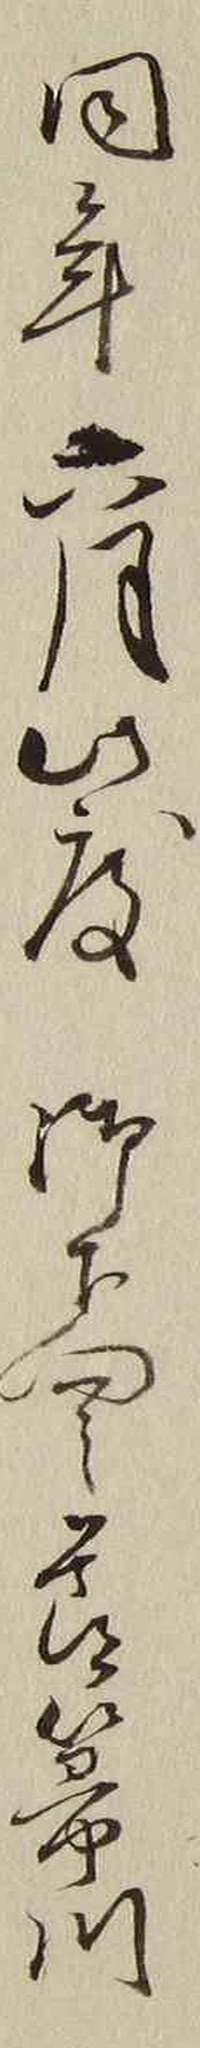同年六月此度御下向之節箒川
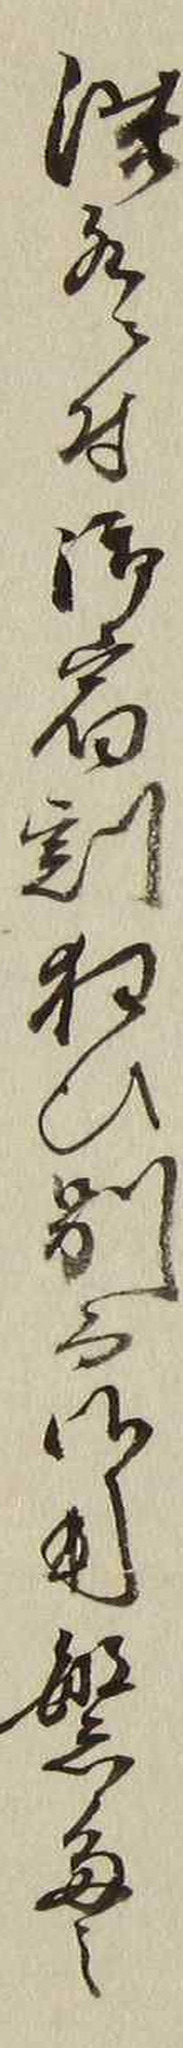洗水ニ付御宿割狂ひ別而御用繁多之
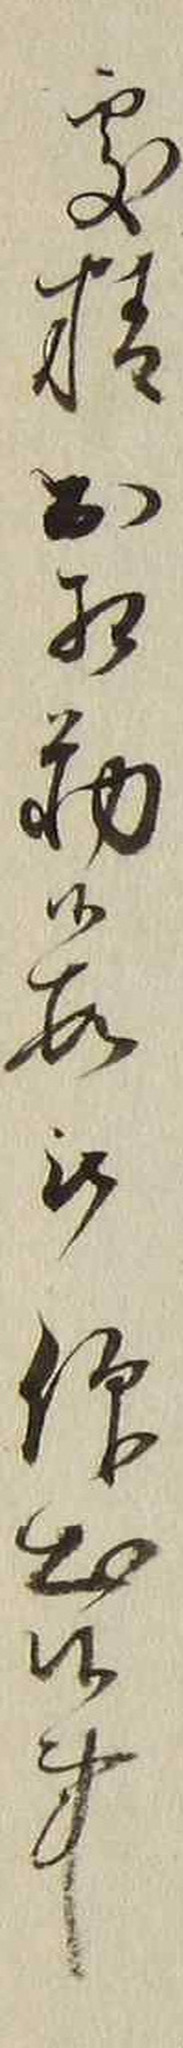処精出相勤候段被仰出候事
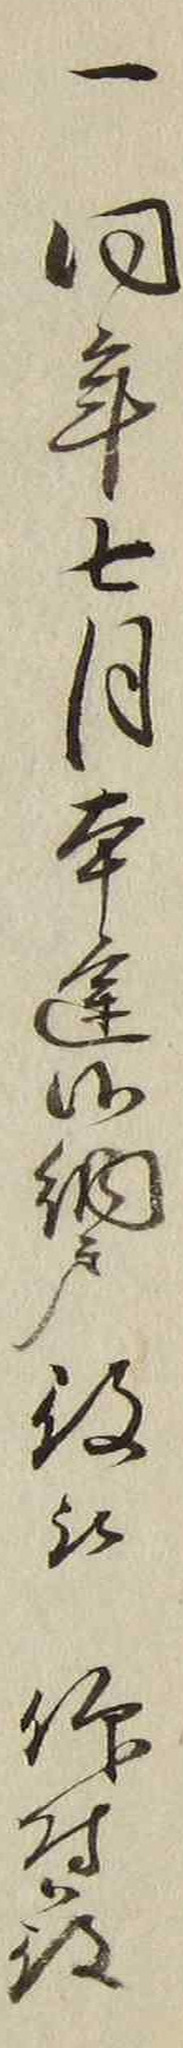一同年七月本達御納戸役被仰付御役
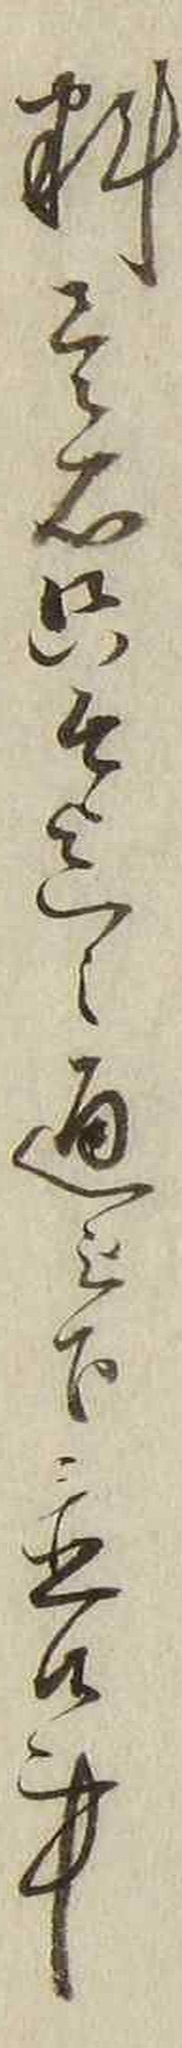料壱石只今迄之通被下置候事

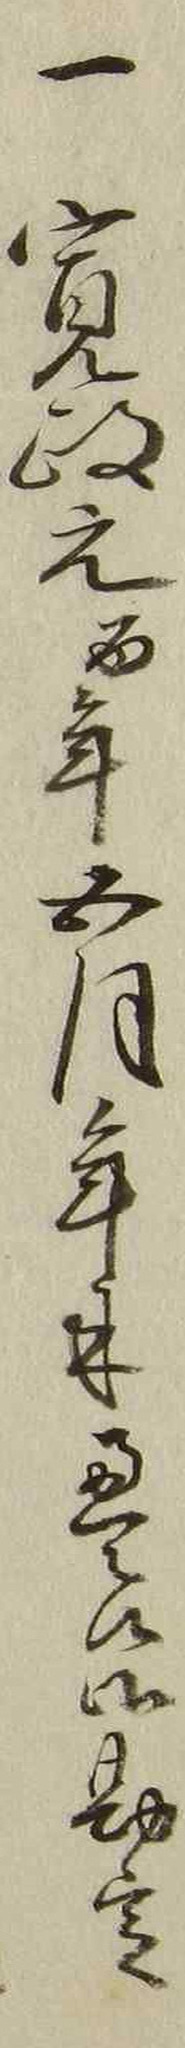一寛政元酉年五月年来畳候御勘定
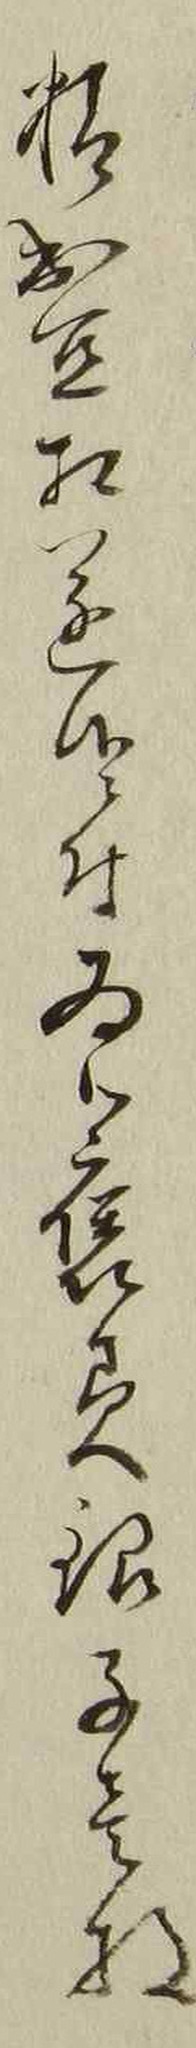精出宜相遂候ニ付為御褒美銀子壱枚
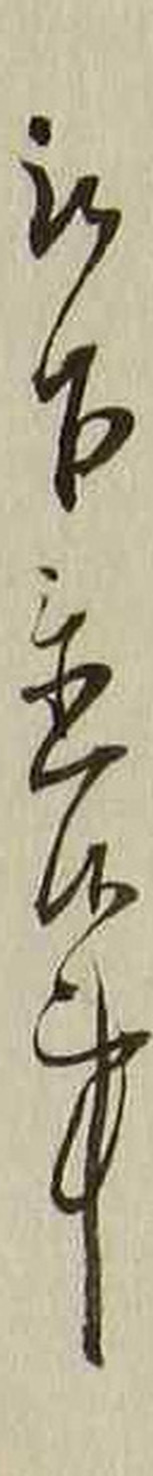被下置候事
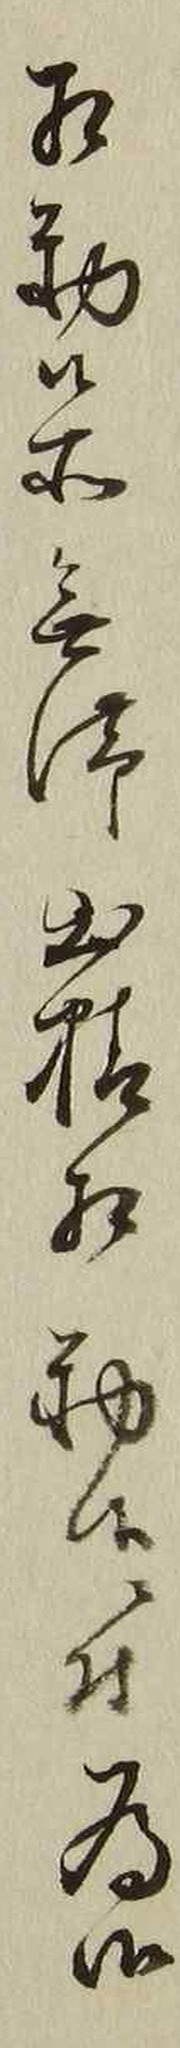相勤候所無滞出精相勤候ニ付為御
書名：諸士系譜　巻之129　た之部5
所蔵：会津若松市立会津図書館
